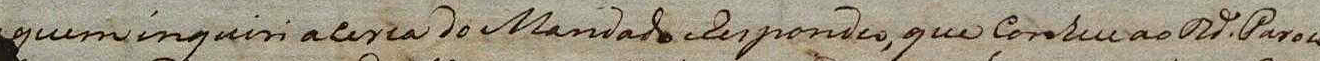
quem inquiri acerca do Mandado e Respondeo, que conhece ao Rd.o Paroco
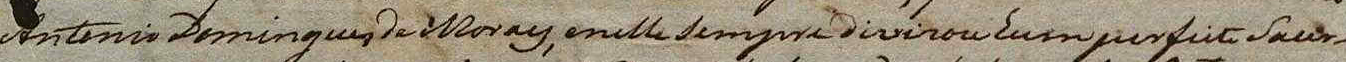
Antonio Domingues de Moraes, e nelle sempre divizou hum perfeito sacer
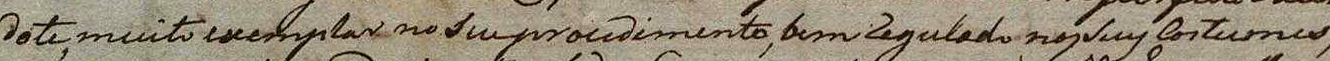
dote, muito exemplar no seu procedimento, bem Regulado nos seus costumes,
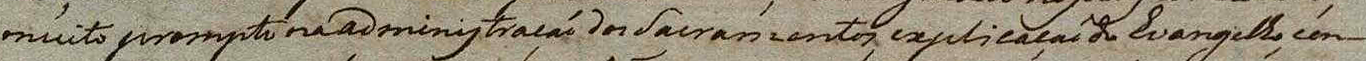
muito prompto na administraçaõ dos sacramentos, explicaçaõ do Evangelho, e en
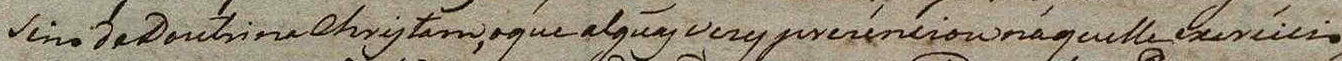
sino da Doutrina christam, o que algūas vezes prezenciou naquelle exercicio,
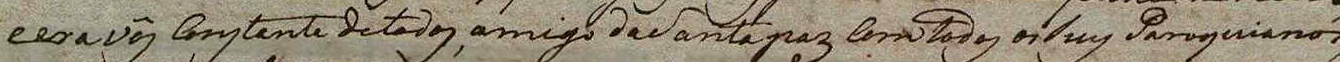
e era vês constante de todos, amigo da Santa paz Com todos os seus Paroquanos,
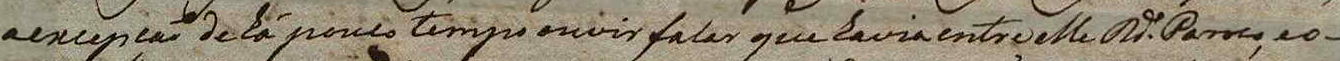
a excepçaõ de há pouco tempo ouvir falar que havia entre elle Rd.o Paroco, e o
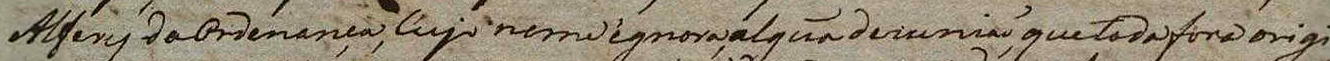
Alferes da Ordenança, Cujo nome ignora, algūa dezuniaõ, que toda fora origi
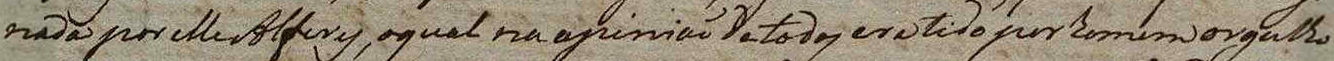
nada por elle Alferes, o qual na opiniaõ de todos era tido por homem orgulho
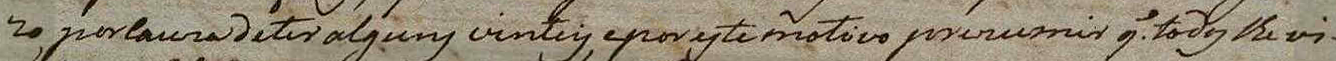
zo, por cauza de ter alguns vinteis, e por este motivo prezumir q̄ todos lhe vi
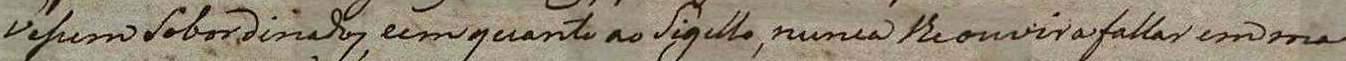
vessem sobordinados, e emquanto ao Sigillo, nunca lhe ouvira fallar em ma
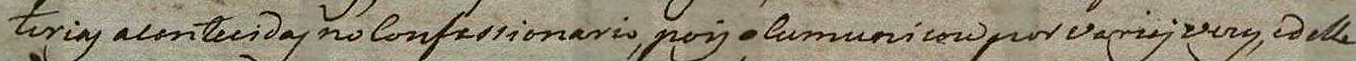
terias acontecidas no Confessionario, pois o Cumunicou por varias vezes, e delle
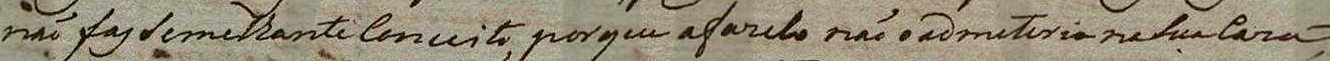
naõ fas semelhante Conceito, porque a fazelo naõ o admeteria na sua caza
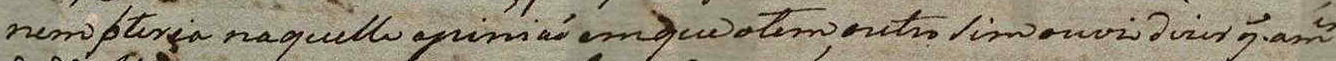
nem o teria naquella opiniaõ em que o tem, outrosim ouvio dizer q̄ a m.er
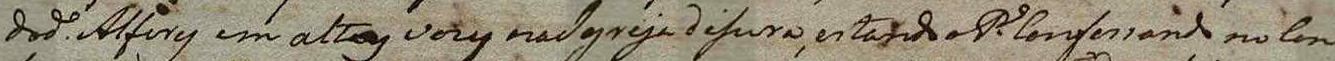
do d.o Alferes em altas vozes na Igreja dissera, estando o P.e Confessando no Con
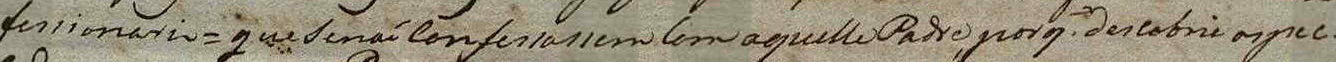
fessionario = que senaõ confessassem com aquelle Padre, porq̄ descobria os pec
